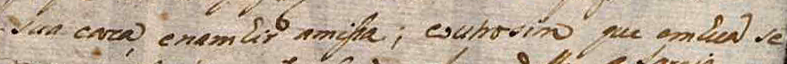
sua caza, e nam hir a missa; e outrosim que em huā se
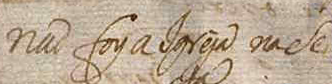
naõ foy a Igreja na se
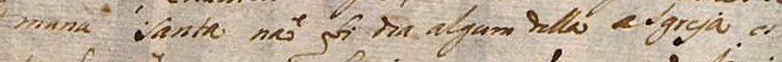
mana santa naõ foi dia algum della a Igreja es
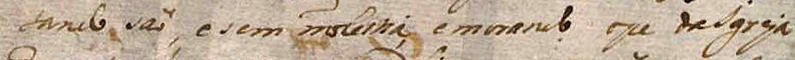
tando saõ, e sem molestia, e morando o pe da Igreja
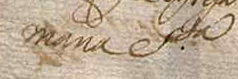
mana S.ta
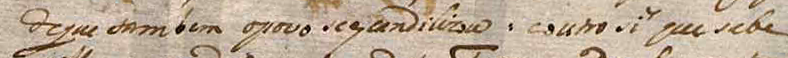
de que tambem o povo se escandilizou; e outrosi que sabe
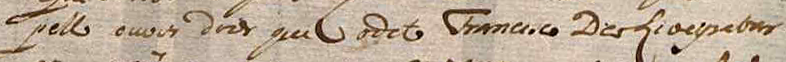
pello ouvir dizer que o dito Francisco De oLiveyra var
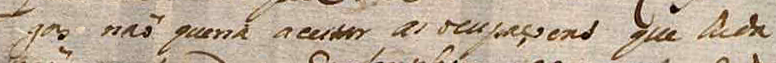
gas naõ queria aceitar as ocupaçoens que lhe da
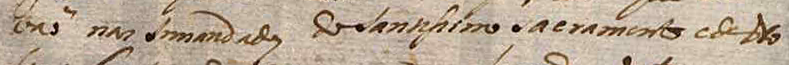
vaõ nas Irmandades do Santissimo sacramento e de No
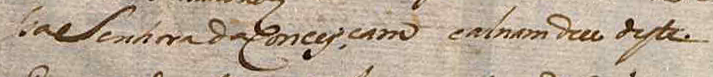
ssa Senhora da Concejçam e al nam dice deste.
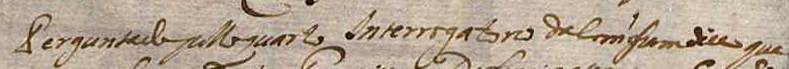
Perguntado pello quarto Interrogatorio da Com̄issam dice que
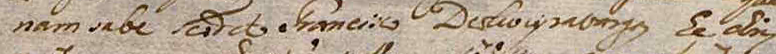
nam sabe se o dito Francisco De oliveyra vargas he chris
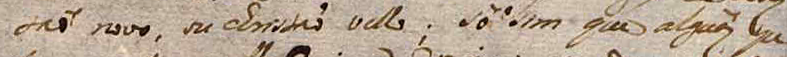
taõ novo, ou christaõ vello; só sim que alguās pe
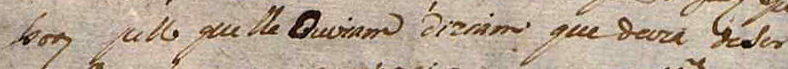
ssoas pello que lhe Ouviram diziam que devia de ser
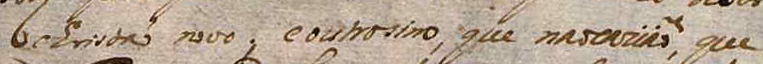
christaõ novo; e outrosim, que na ocaziaõ, que
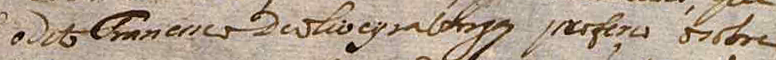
o dito Francisco de oliveyra vargas profereo o sobre
